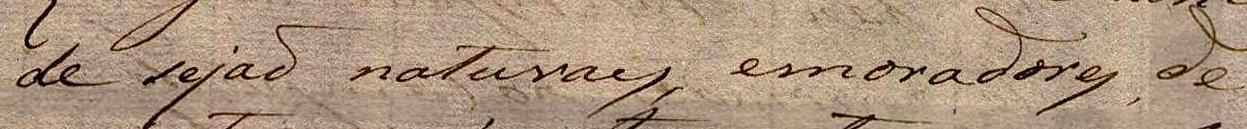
de sejaõ naturaes, e moradores, de
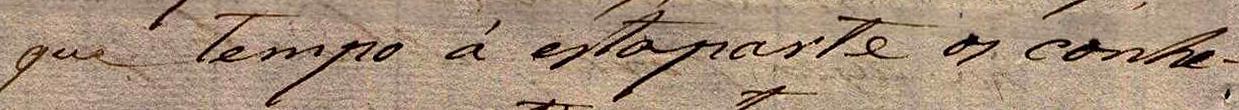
que tempo á esta parte os conhe
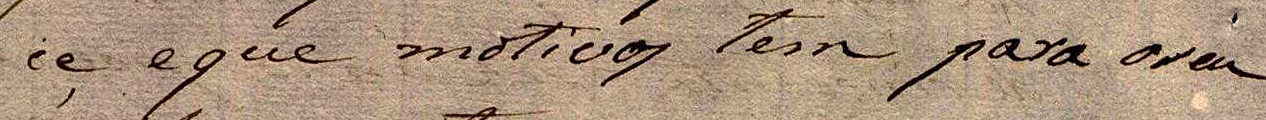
ce, e que motivos tem para o seu
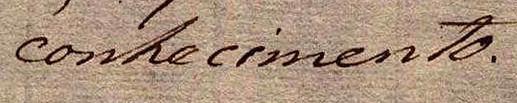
conhecimento.
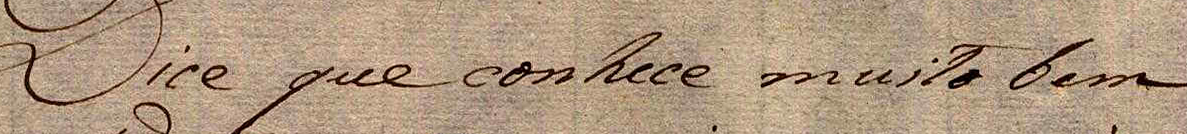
Dice que conhece muito bem
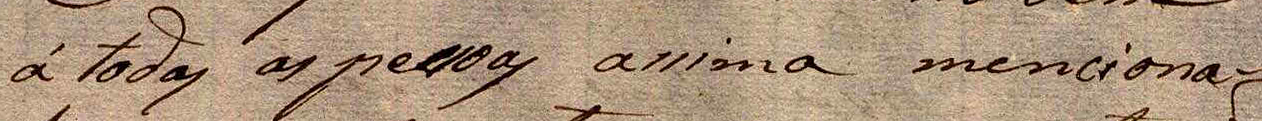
á todas as pessoas assima menciona
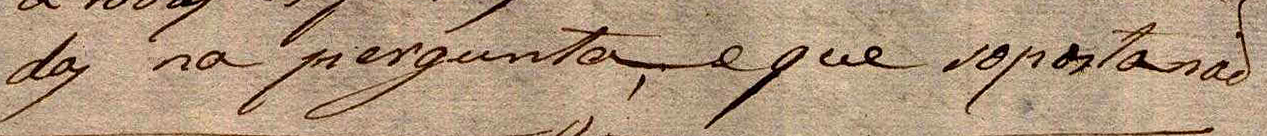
das na pergunta, e que soposta naõ
